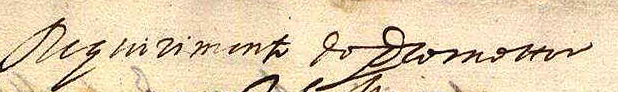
Requirimento do promottor
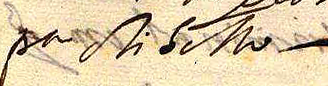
pa o libello
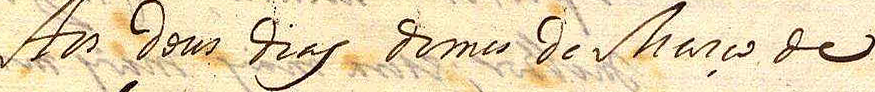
Aos dous dias do mes de Março de
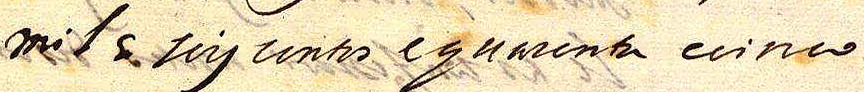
mil E seiscentos e quarenta e cinco
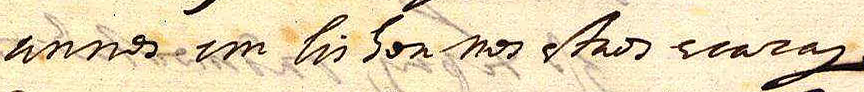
annos em lisboa nos Estaos E cazas
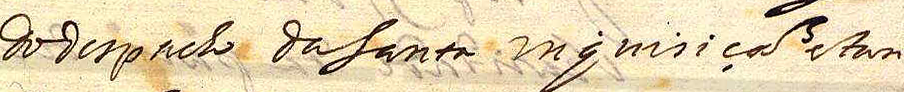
do despacho da santa inquisiçaõ estan
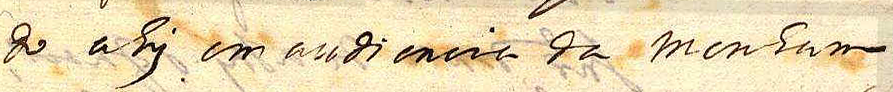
do ahy em audiencia da menham
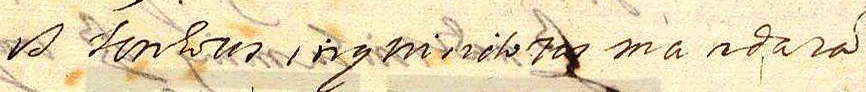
os senhores inquisidores mandaraõ
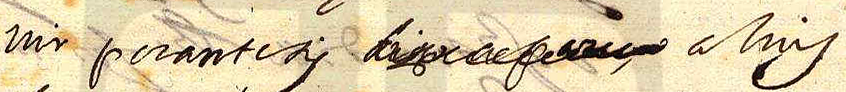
uir perante sy _ a luis
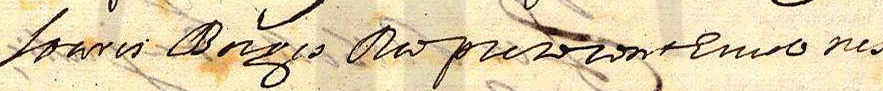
soares Borges Reo prezo contheudo nes
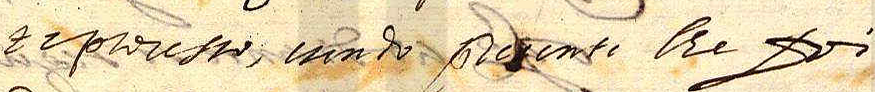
te processo, uindo presente lhe foi
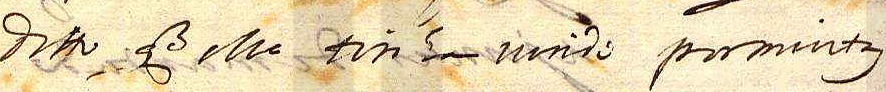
ditto, q̄ elle tinha uindo por muitas
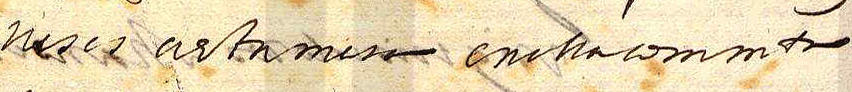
ueses a esta mesa e nella com mta
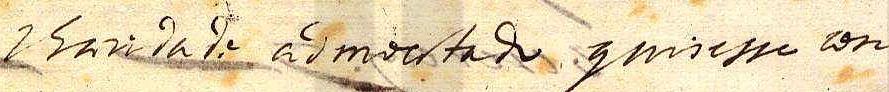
charidade admoestado quisesse con
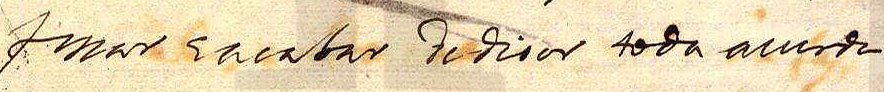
firmar E acabar de diser toda a uerda
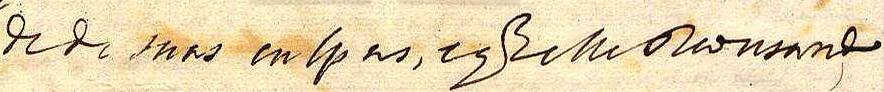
de de suas culpas, e q̄ elle Reo usando
